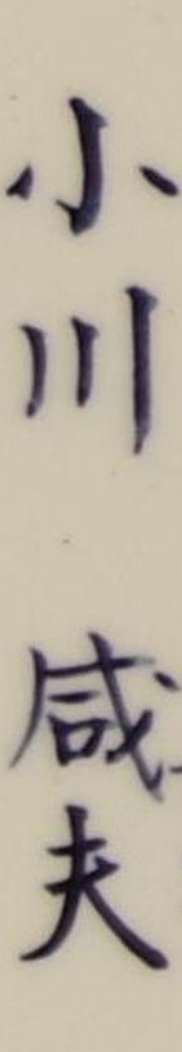小川咸夫
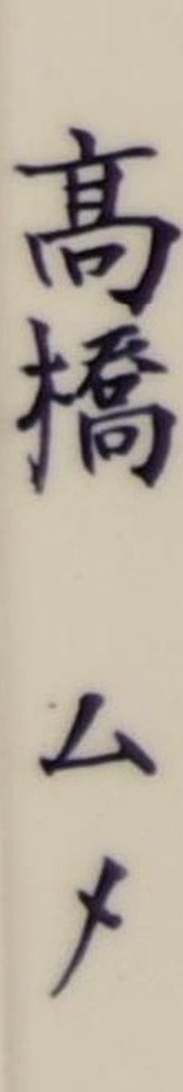高橋ムメ

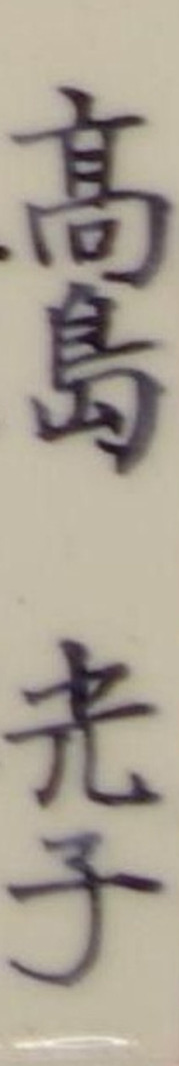高島光子
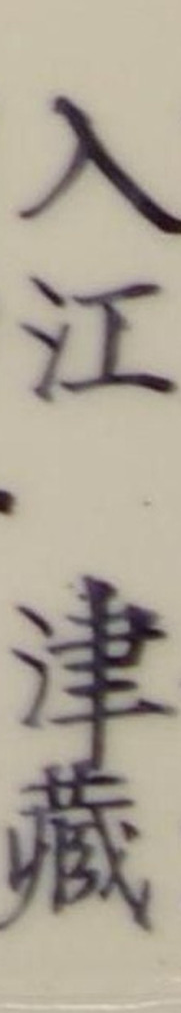入江津蔵
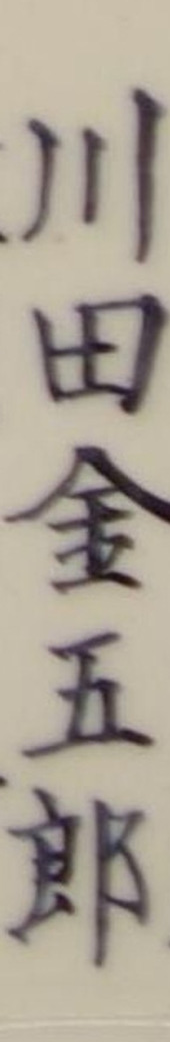川田金五郎
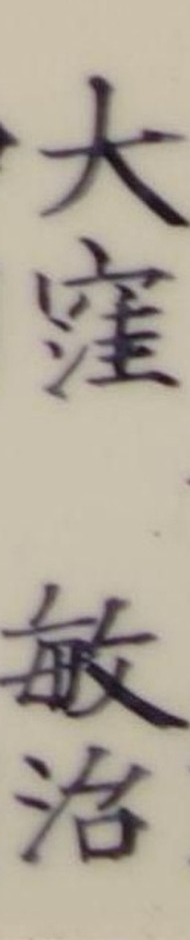大窪敏治
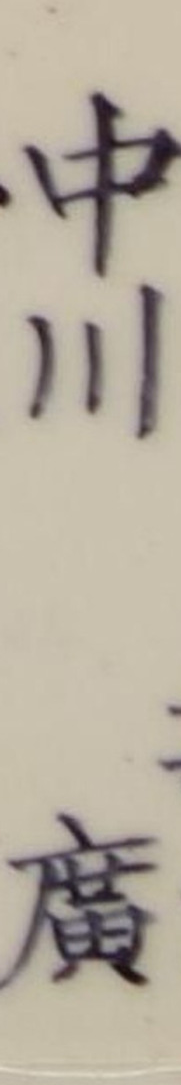中川広
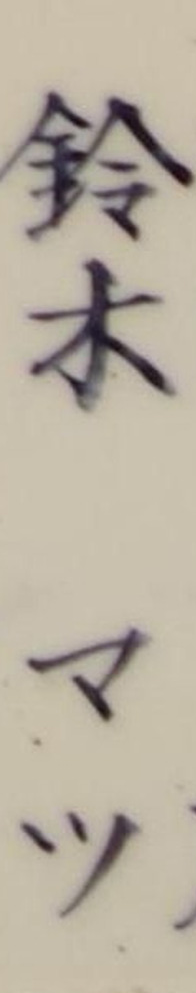鈴木マツ
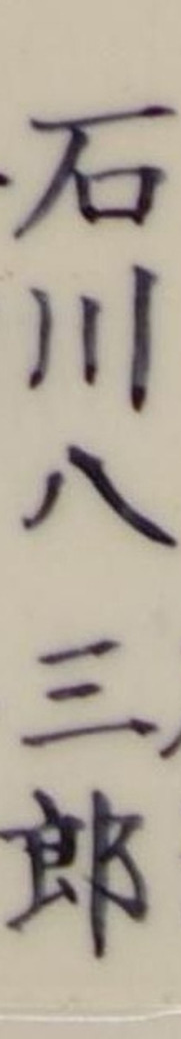石川八三郎
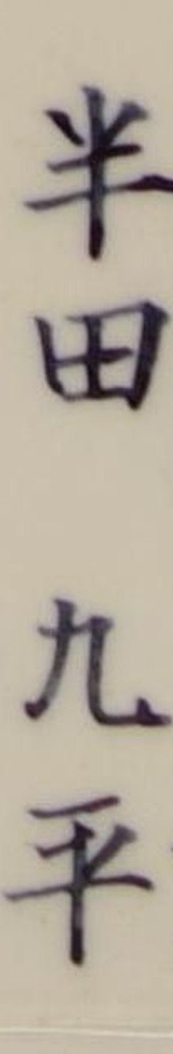半田九平
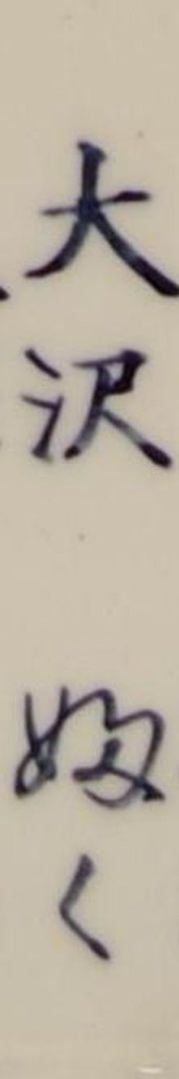大沢ふく
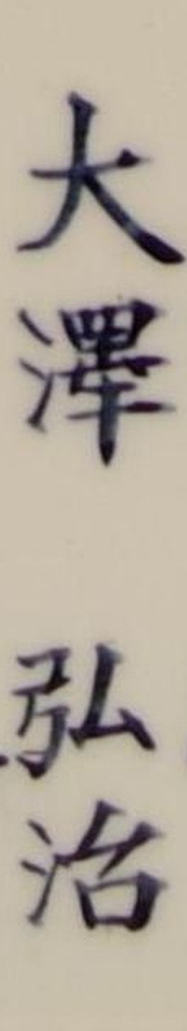大澤弘治
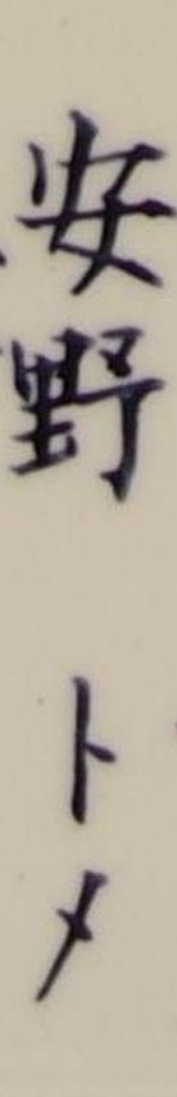安野トメ
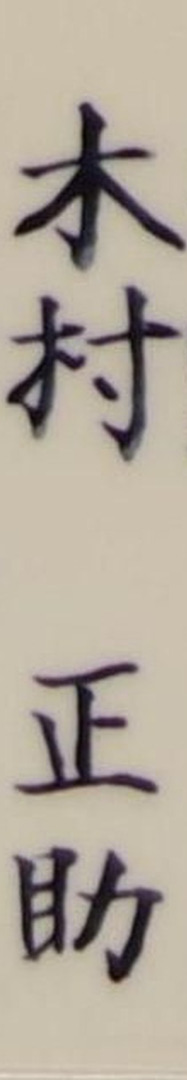木村正助
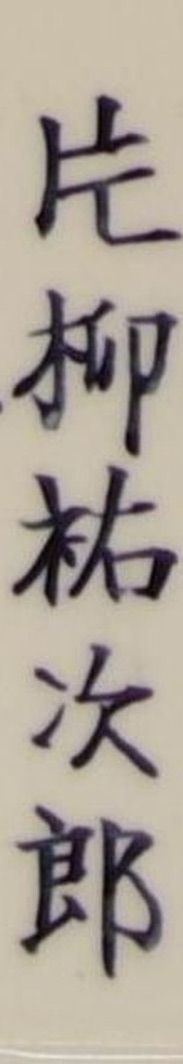片柳祐次郎
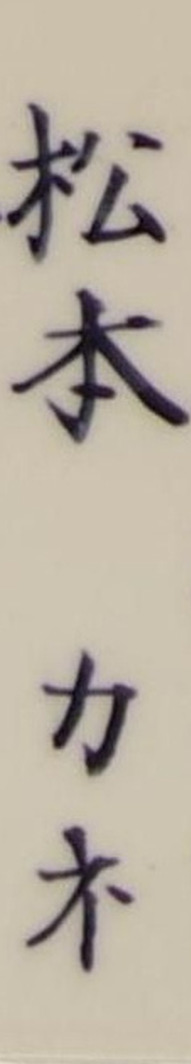松本カネ
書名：E~L
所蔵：高野山金剛峯寺
